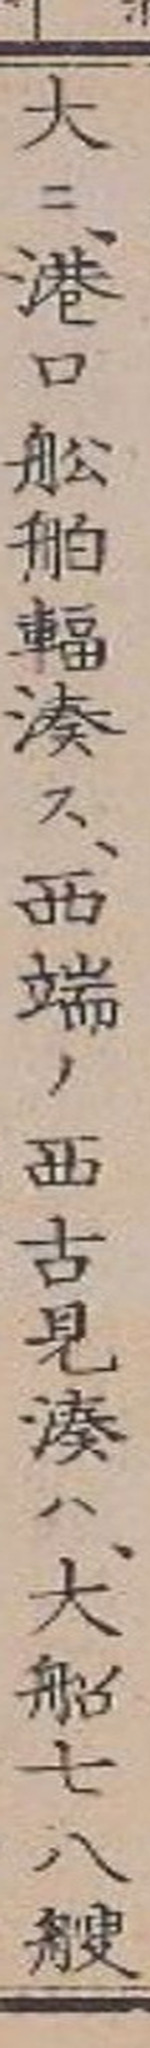大ニ、港口船舶輻湊ス、西端ノ西古見湊ハ、大船七八艘
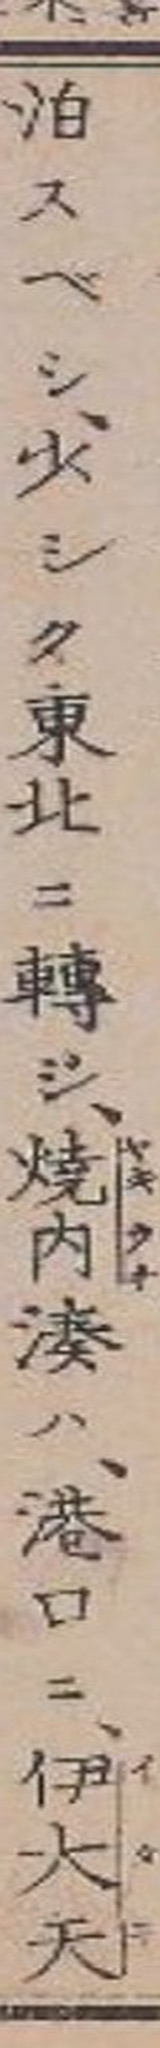泊スベシ、少シク東北ニ転ジ、焼内湊ハ、港口ニ、伊大天
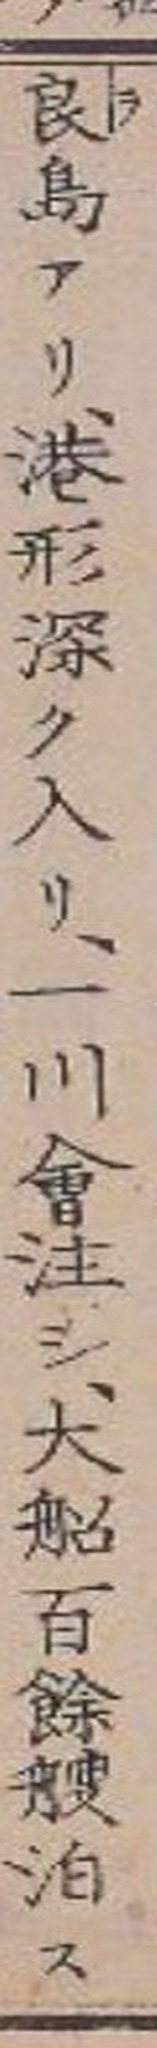良島アリ、港形深ク入リ、一川会注シ、大船百余艘泊ス
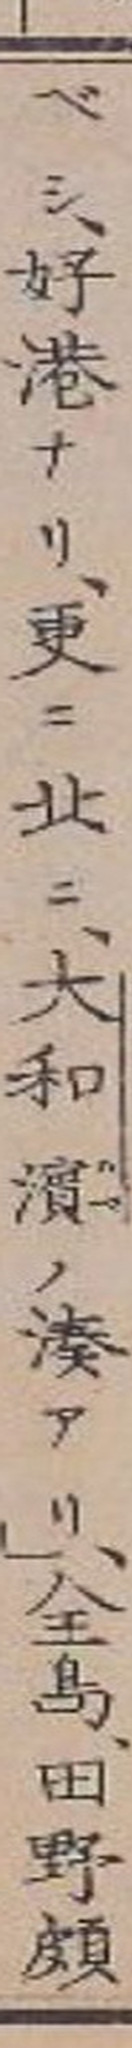ベシ、好港ナリ、更ニ北ニ、大和浜ノ湊アリ、」全島、田野頗
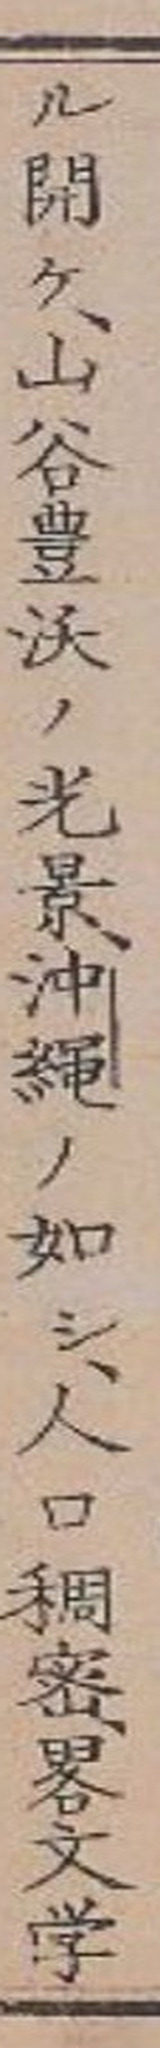ル開ケ、山谷豊沃ノ光景、沖縄ノ如シ、人口稠密、略文学
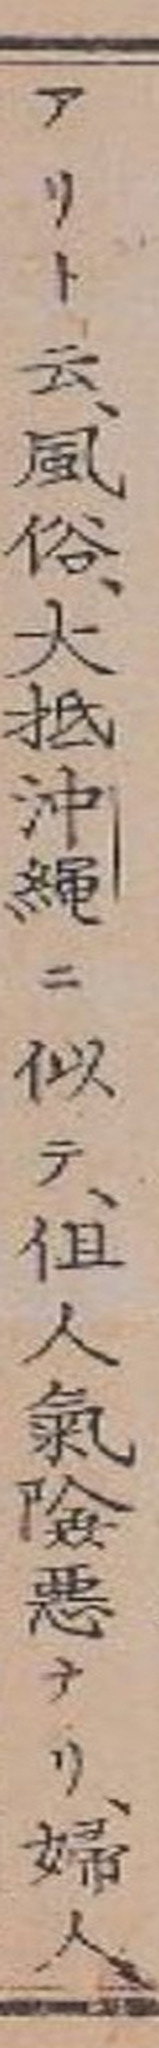アリト云、風俗、大抵沖縄ニ似テ、但人気険悪ナリ、婦人、

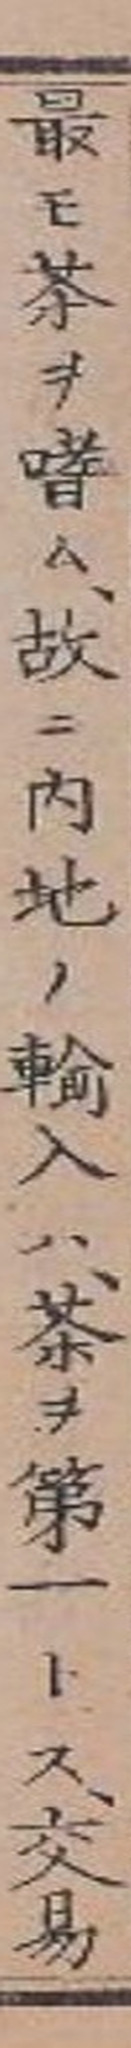最モ茶ヲ嗜ム、故ニ内地ノ輸入ハ、茶ヲ第一トス、交易
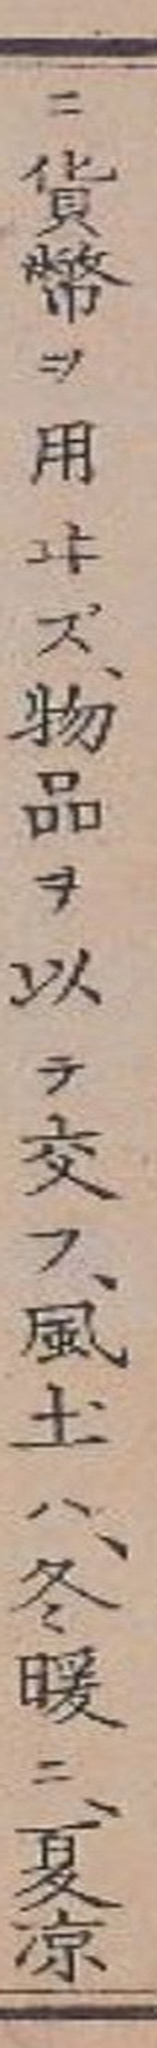ニ貨幣ヲ用ヰズ、物品ヲ以テ交フ、風土ハ、冬暖ニ、夏涼
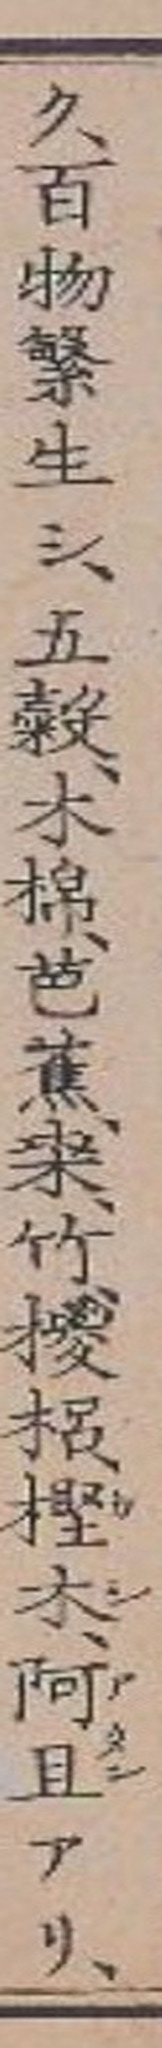ク、百物繁生シ、五穀、木棉、芭蕉、桑、竹、棕梠、樫木、阿且アリ、
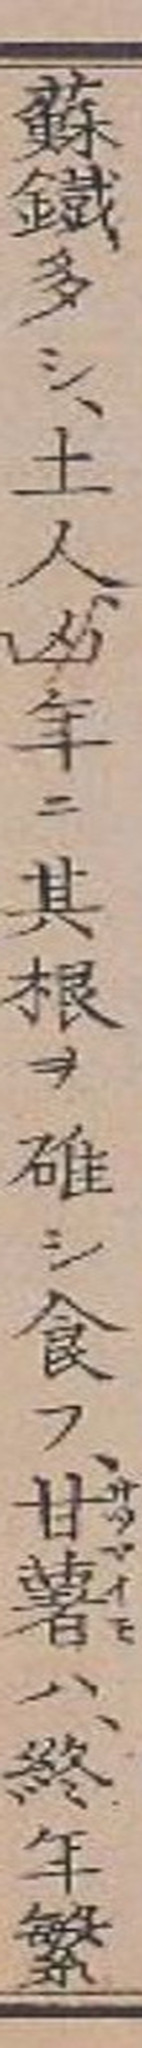蘇鉄多シ、土人、凶年ニ其根ヲ碓シ食フ、甘薯ハ、終年繁
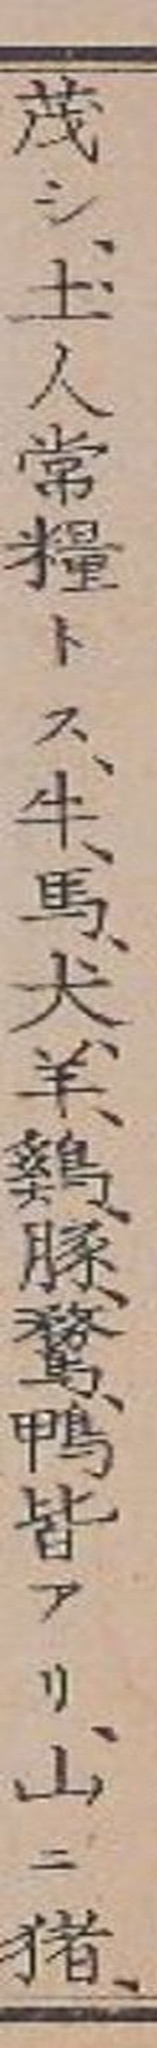茂シ、土人常糧トス、牛、馬、犬、羊、鶏、豚、騖、鴨皆アリ、山ニ猪、
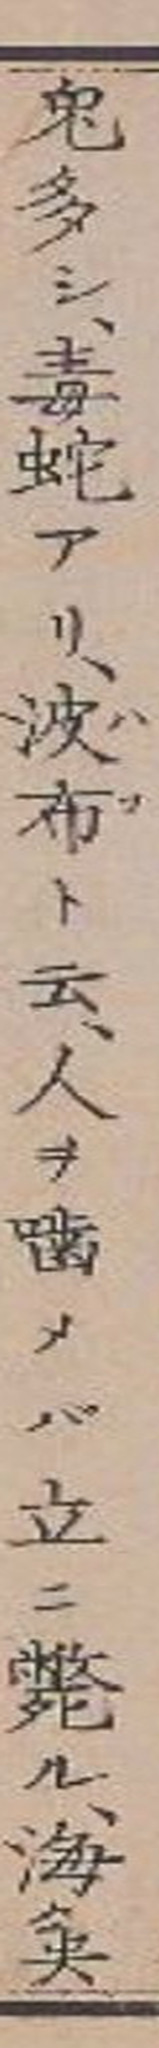兎多シ、毒蛇アリ、波布ト云、人ヲ嚙メバ立ニ斃ル、海魚
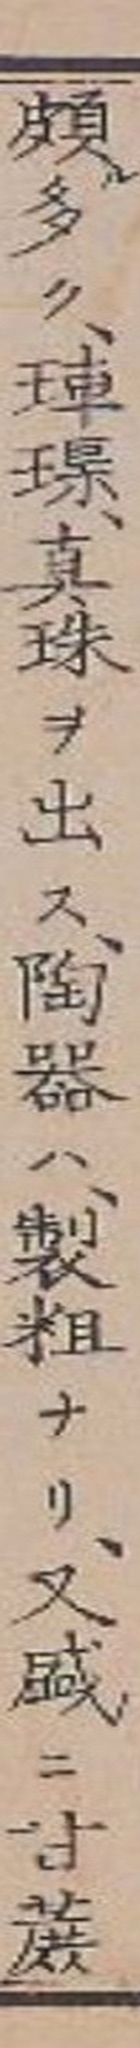頗多ク、、真珠ヲ出ス、陶器ハ、製粗ナリ、又盛ニ甘蔗
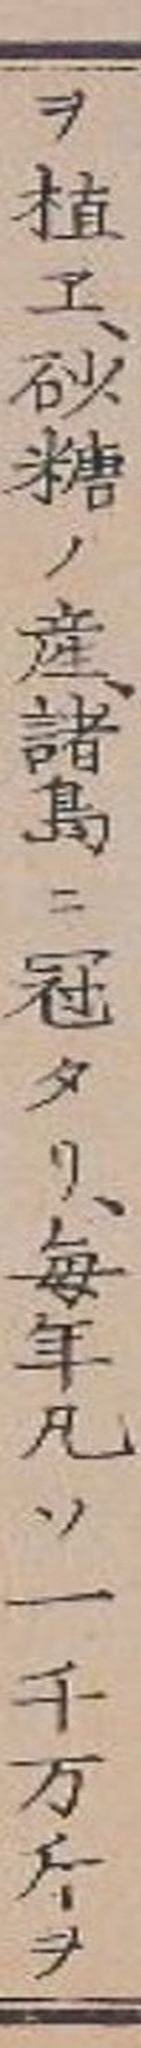ヲ植ヱ、砂糖ノ産、諸島ニ冠タリ、毎年凡ソ一千万斤ヲ
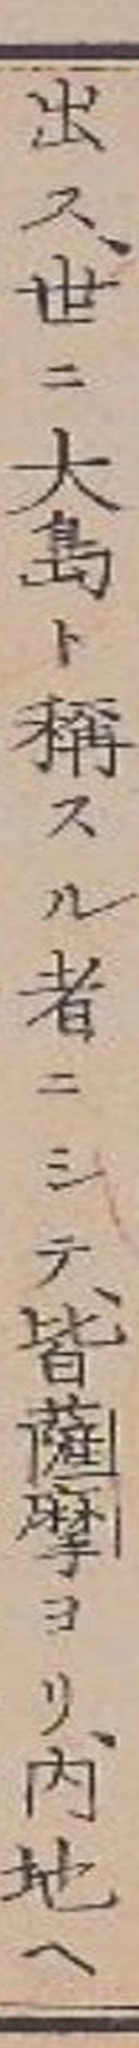出ス、世ニ大島ト称スル者ニシテ、皆薩摩ヨリ、内地ヘ
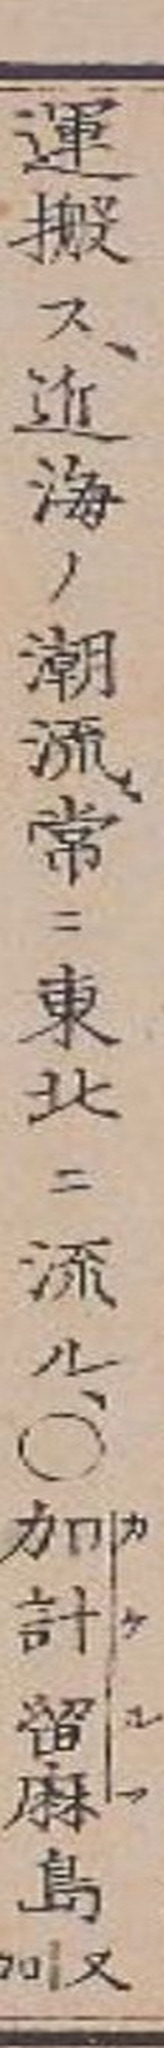運搬ス、近海ノ潮流、常ニ東北ニ流ル、○加計留麻島又加
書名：琉球新誌 巻上
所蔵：University of the Ryukyus Library
